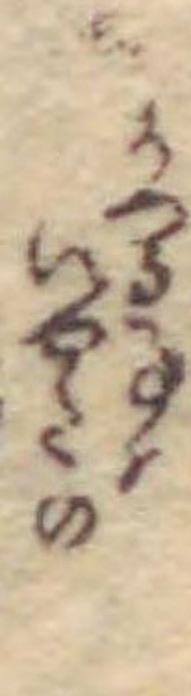いやたの
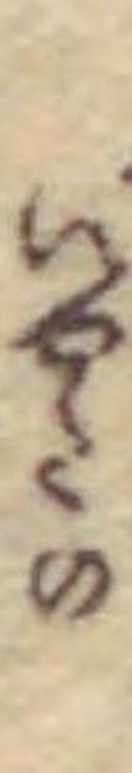いやたの
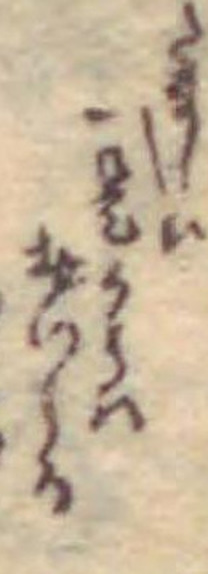〽是からは
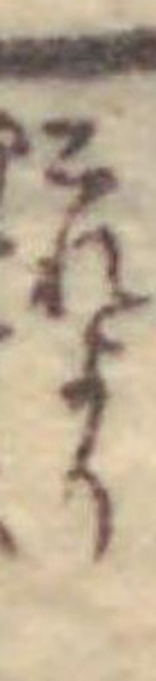これより
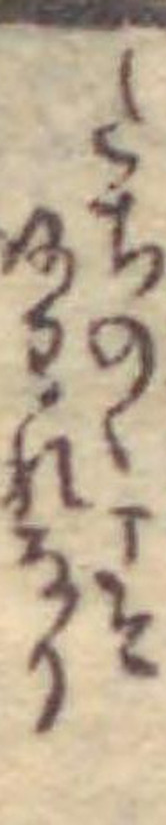たちのくこそ
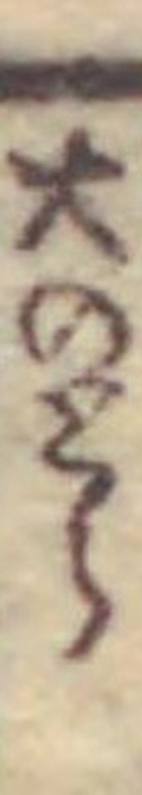大のとら
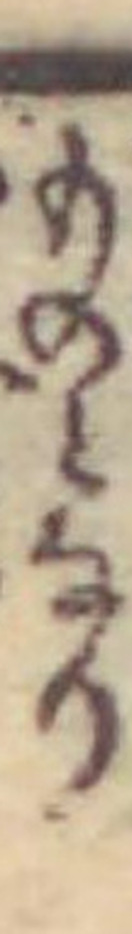ものとなり
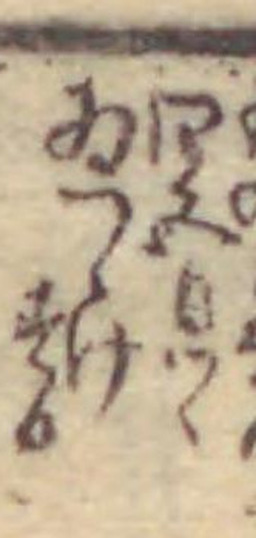ゐつゝけ
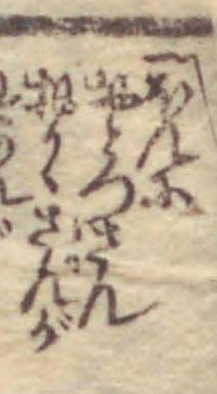おとつさん
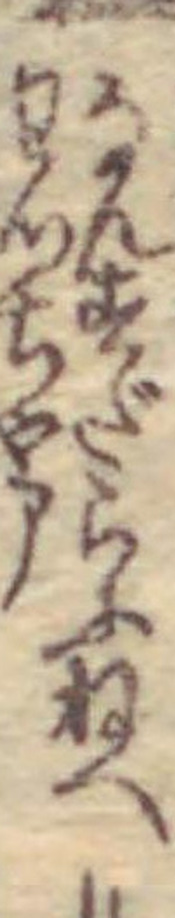なんすだらふねへ
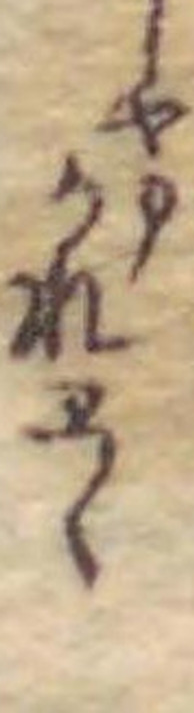かれヱヽ
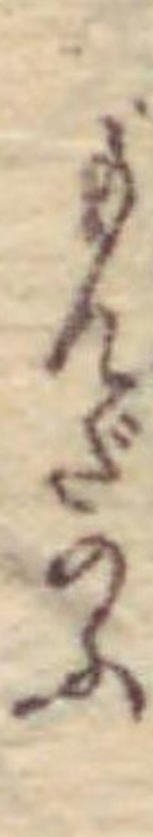もんだのふ
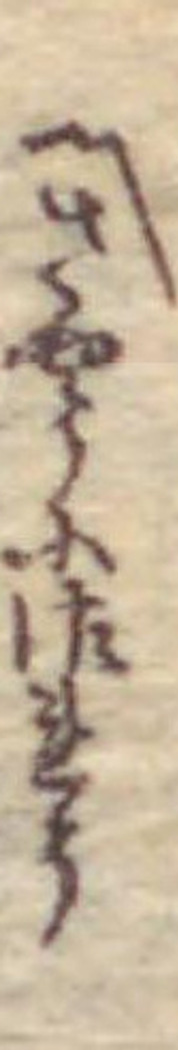〽さやふに御れう
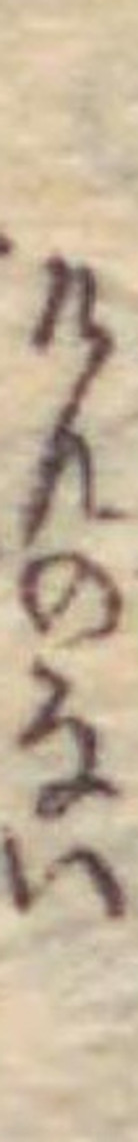けんのない
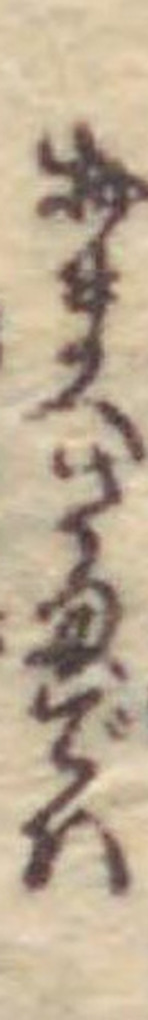おまへさまでは
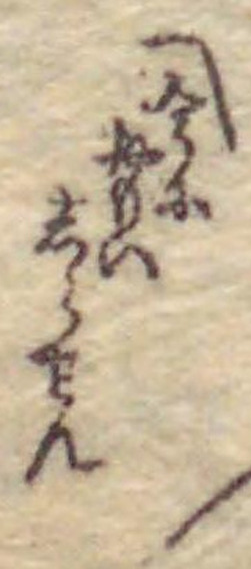しらせん
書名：心学早染艸 : 3巻
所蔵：国立国会図書館 National Diet Library, JAPAN
